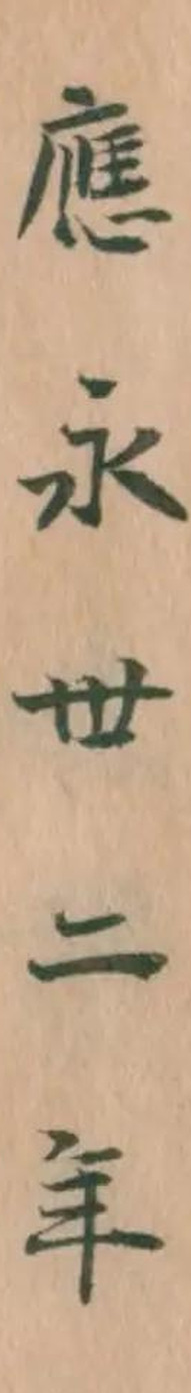応永卅二年
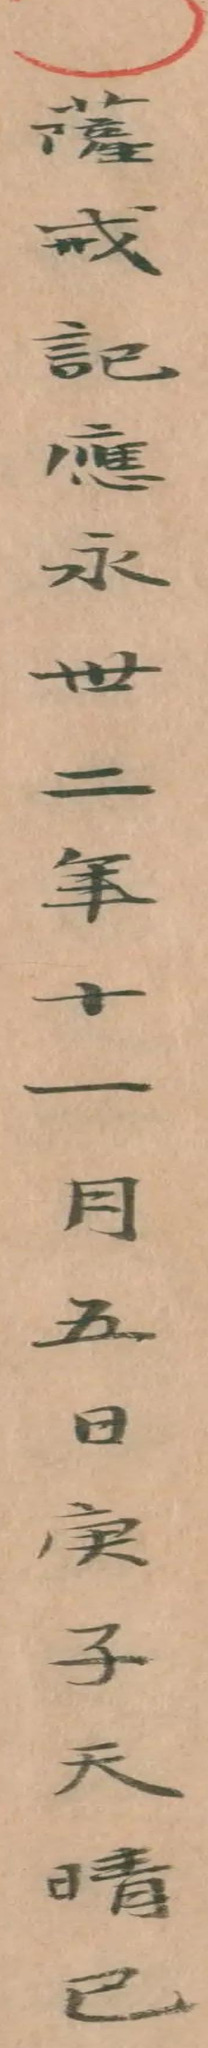○薩戒記応永卅二年十一月五日庚子天晴巳

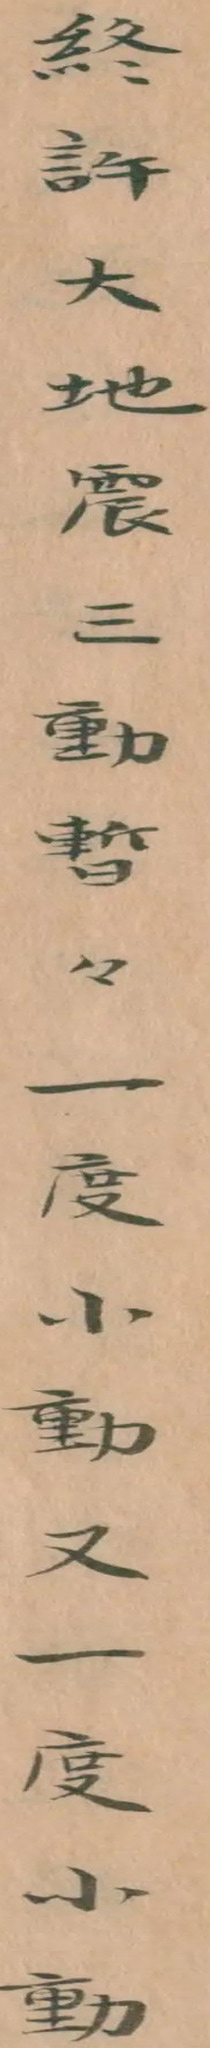終許大地震三動暫々一度小動又一度小動
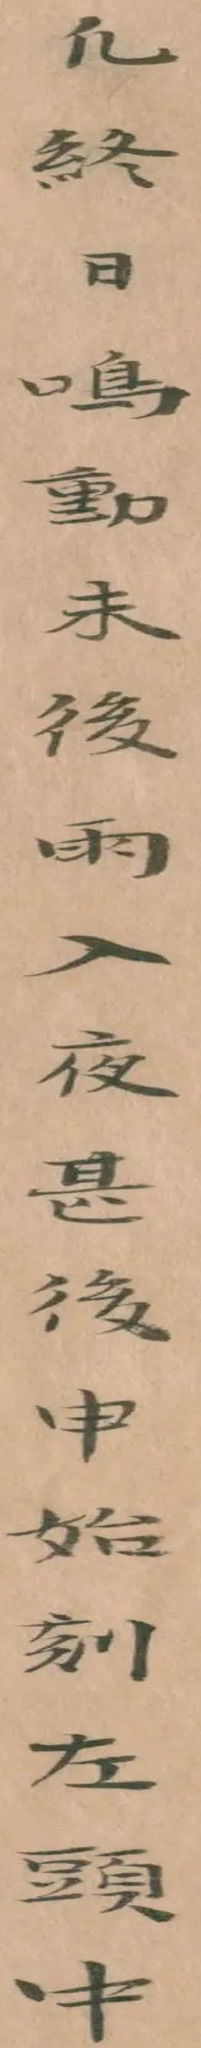凡終日鳴動未後雨入夜甚後申始刻左頭中
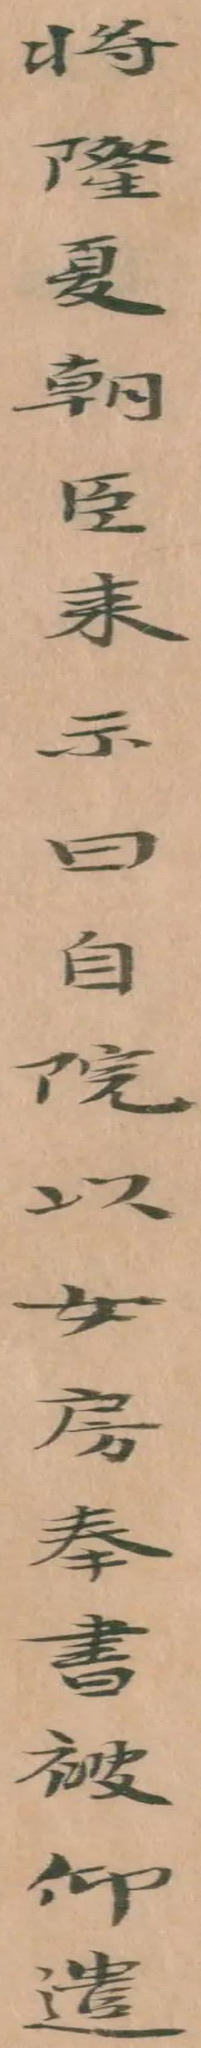将隆夏朝臣来示曰自院以女房奉書被仰遣
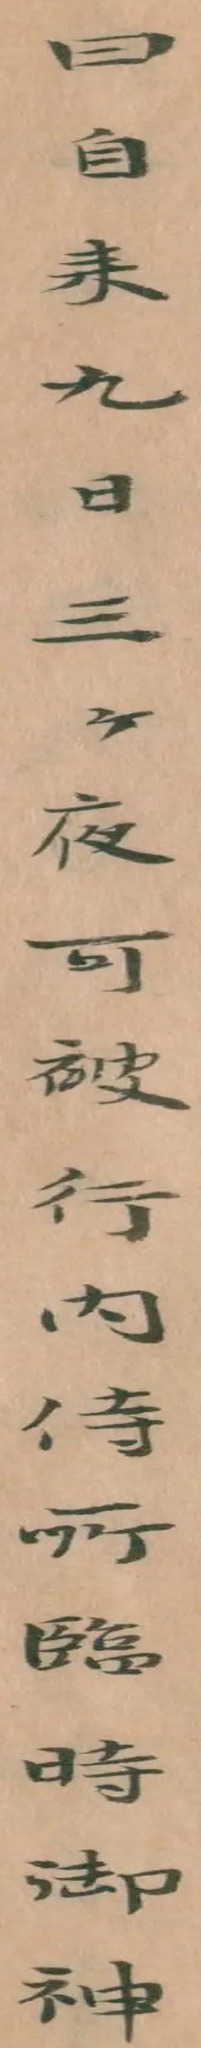曰自来九日三ヶ夜可被行内侍所臨時御神
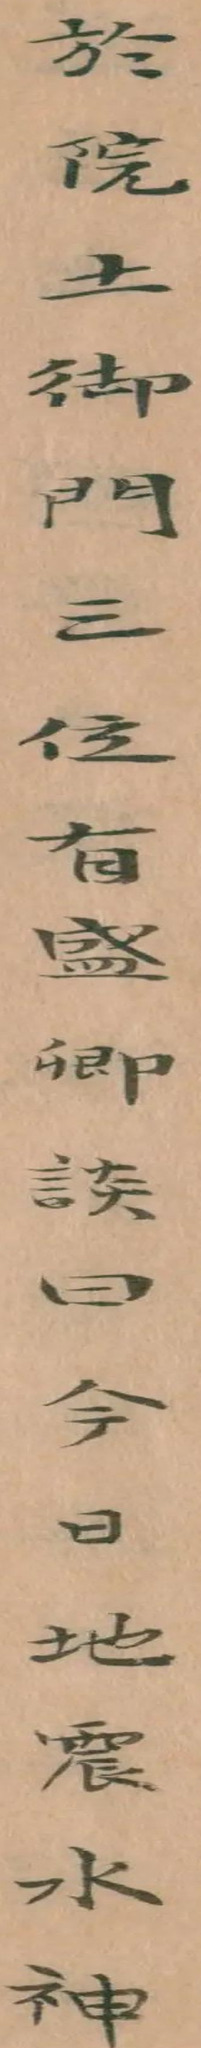於院土御門三位有盛卿談曰今日地震水神
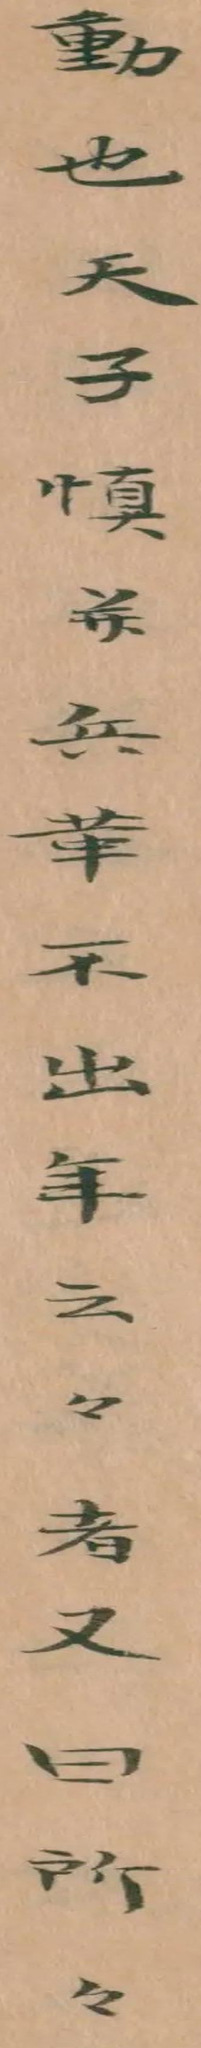動也天子慎幷兵革不出年云々者又曰所々
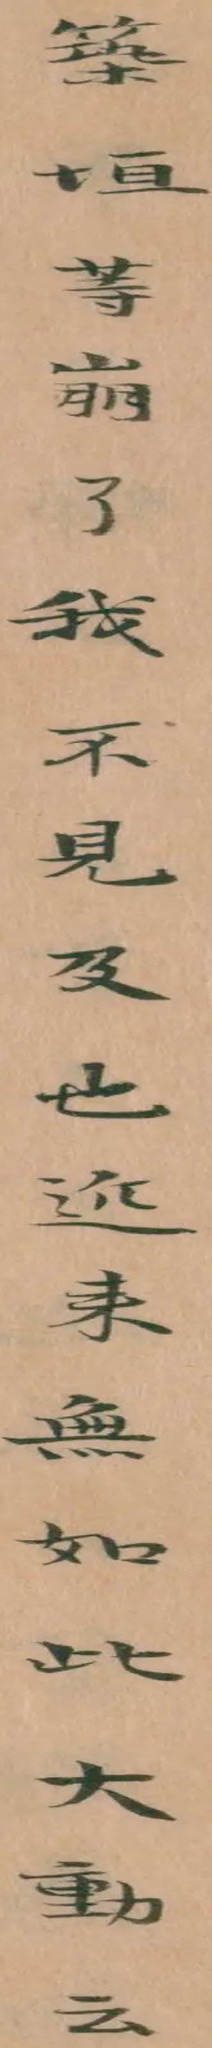築垣等崩了我不見及也近来無如此大動云
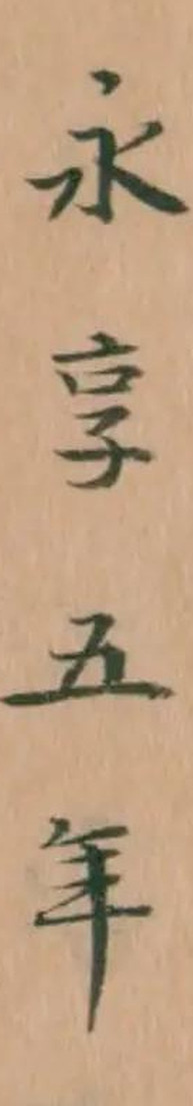永享五年
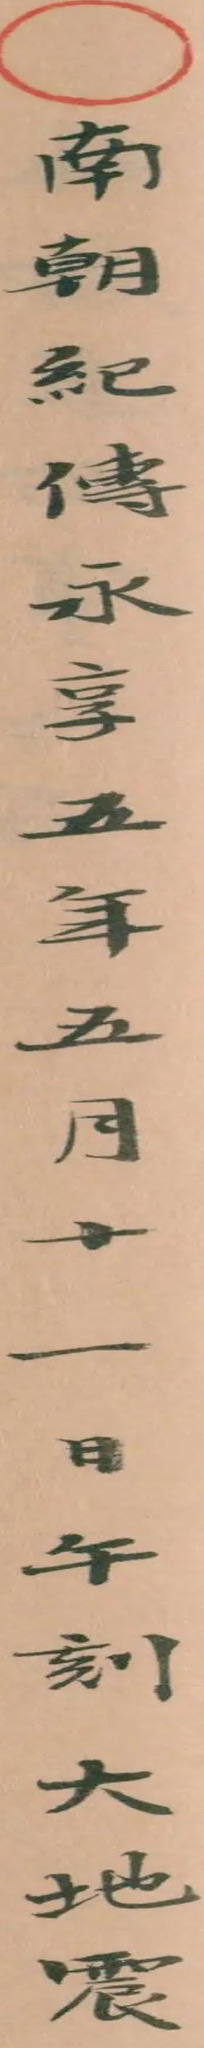○南朝紀伝永享五年五月十一日午刻大地震
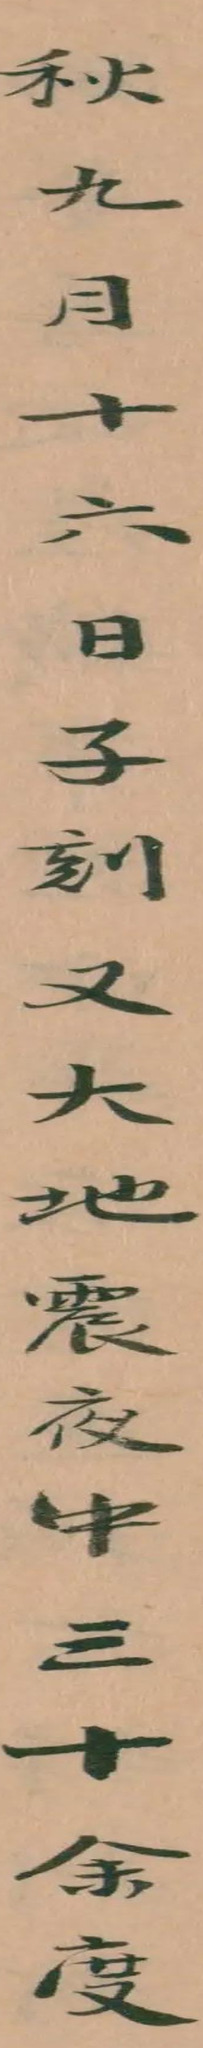秋九月十六日子刻又大地震夜中三十余度
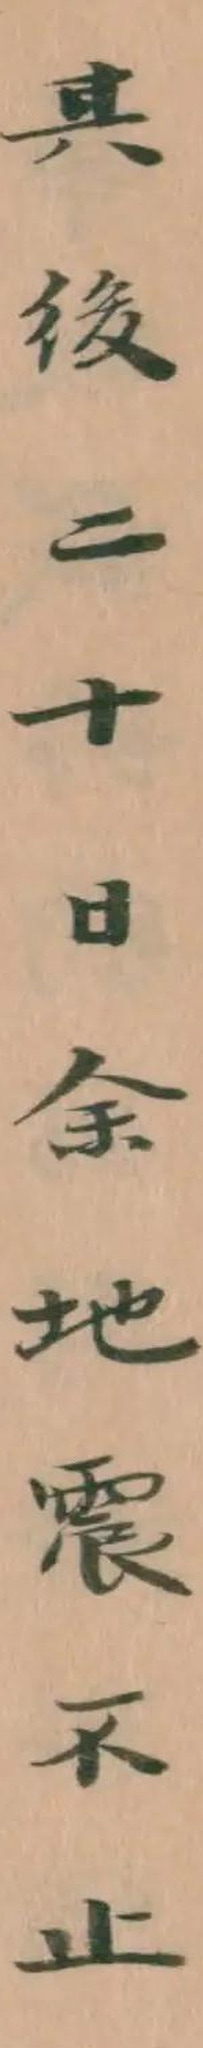其後二十日余地震不止
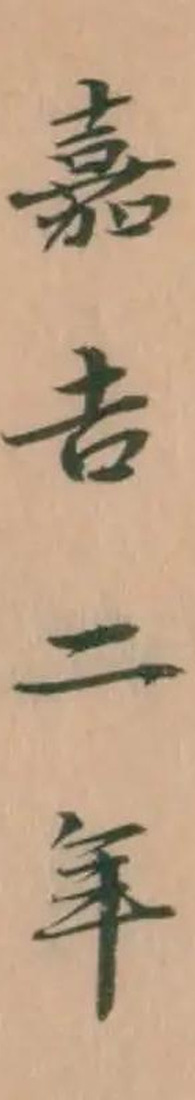嘉𠮷二年
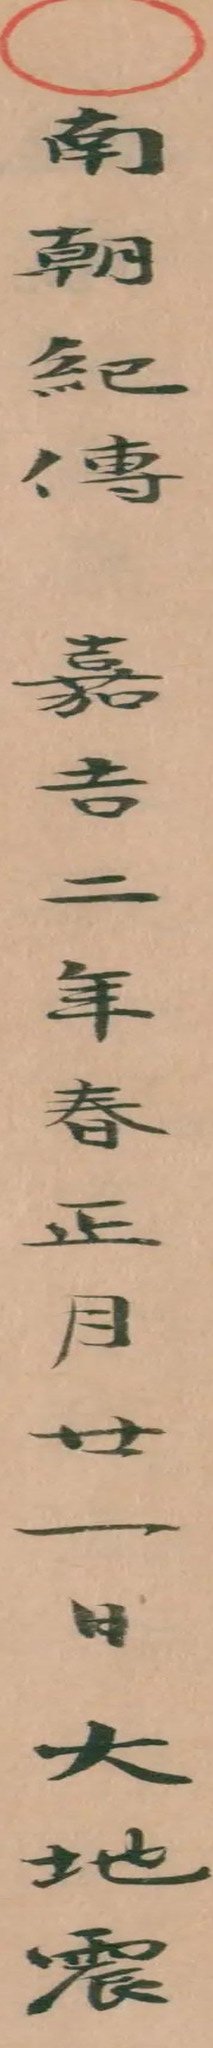○南朝紀伝嘉𠮷二年春正月廿一日大地震
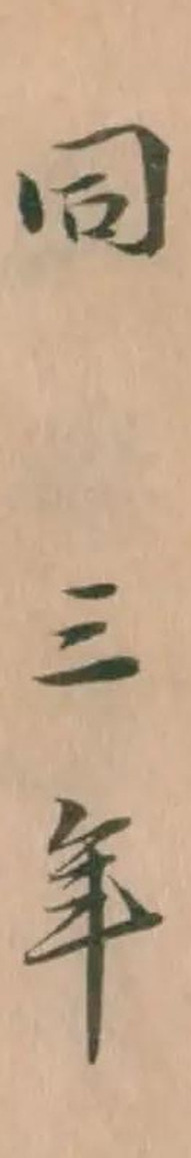同三年
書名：地災撮要. 巻5-6(地震之部)
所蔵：国立国会図書館 National Diet Library, JAPAN
